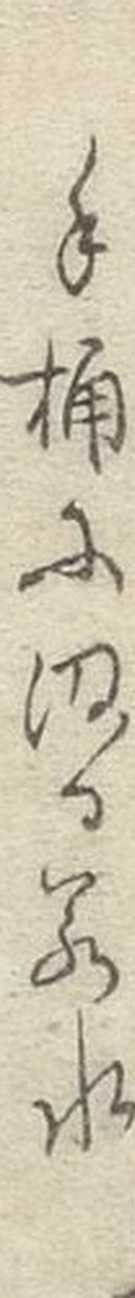手桶に汲る若水
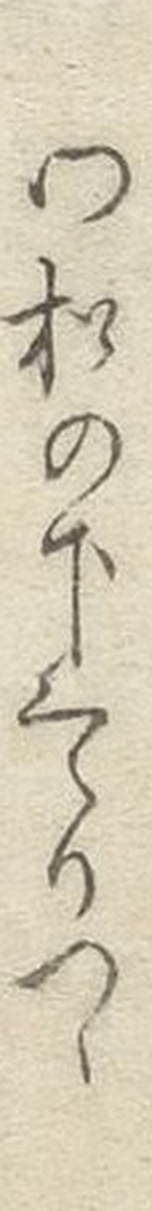門松の下くゝりつゝ
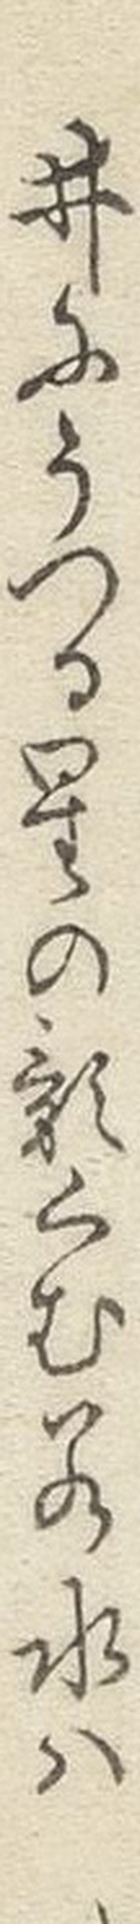井にうつる星の影くむ若水はさの
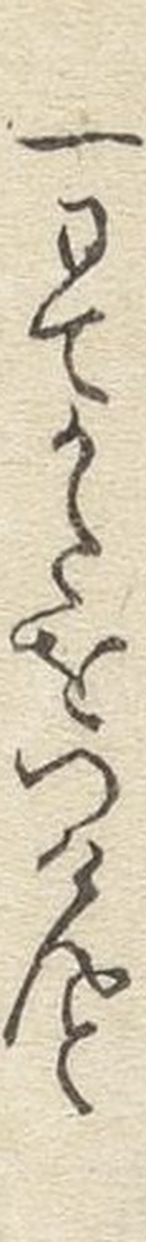一日てかたをつけんと
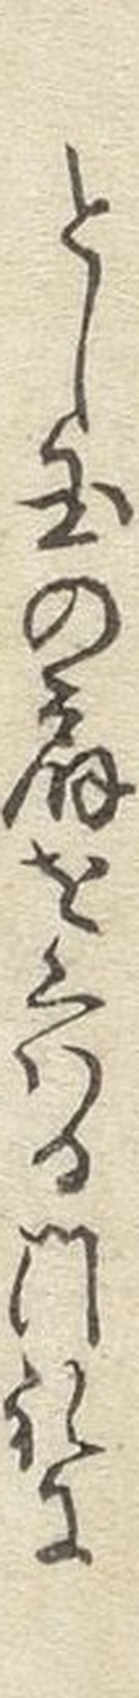とし玉の扇をくはる門礼に
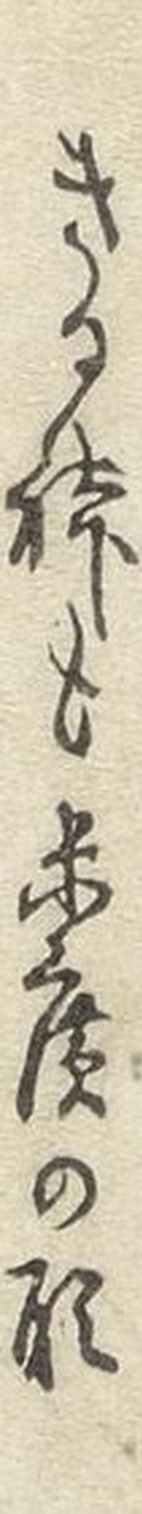きる裃も末広の形
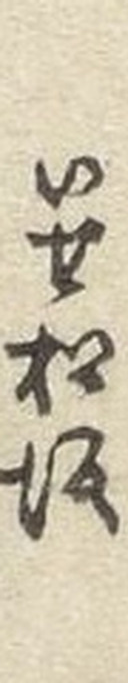いせ松坂
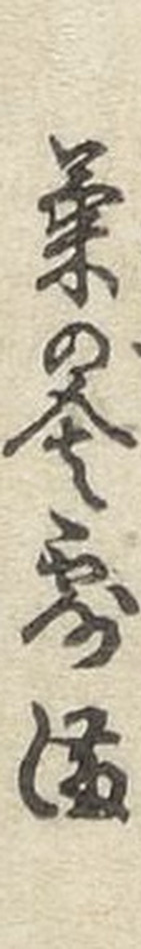菊の舎露満
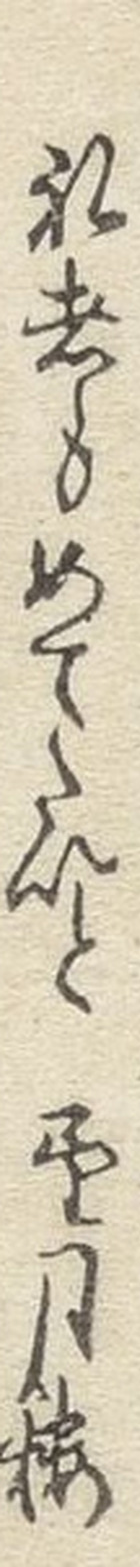礼者もめてたいと望月楼
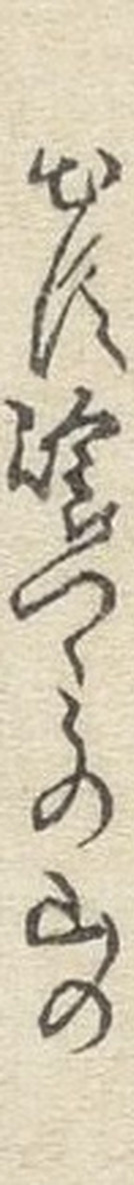出喰つみの山の
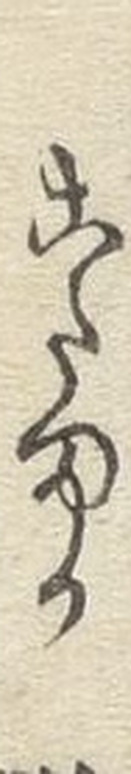こたまか
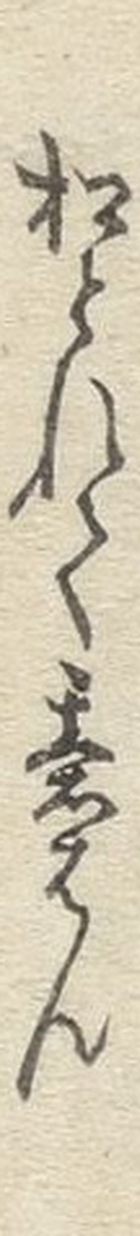松とれて碁はん
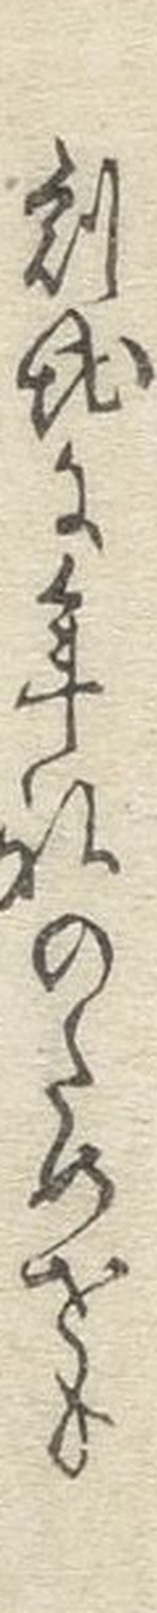割地に年礼のためをも
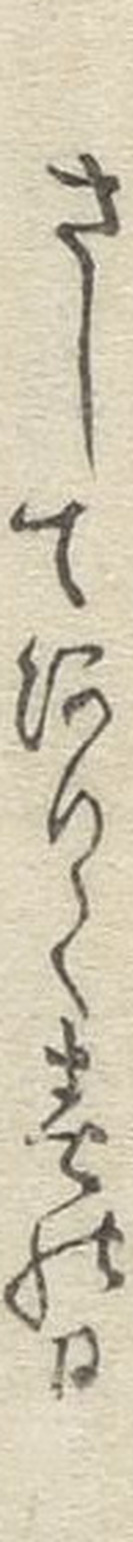さしてありく春の日
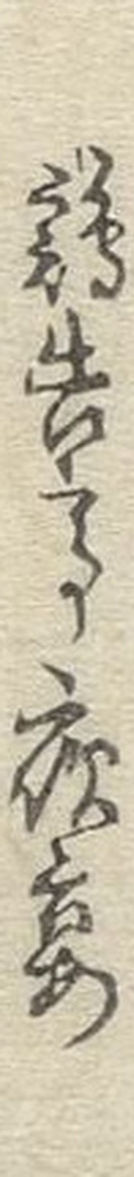鶴告亭夜宴
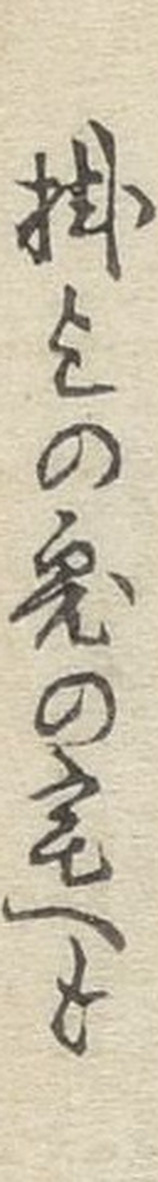掛与の鬼の宅へも
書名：Picture Album of People with Kyōka (Light Verse) (Kyōka shiki jinbutsu 狂歌四季人物)
